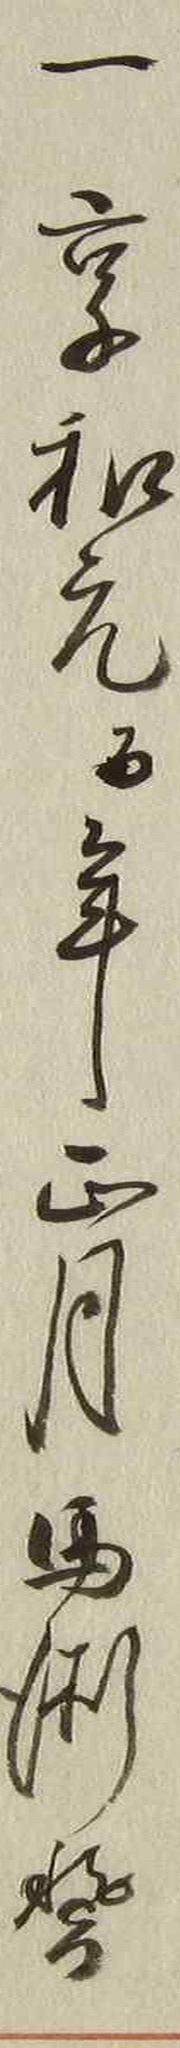一享和元酉年正月馬術稽
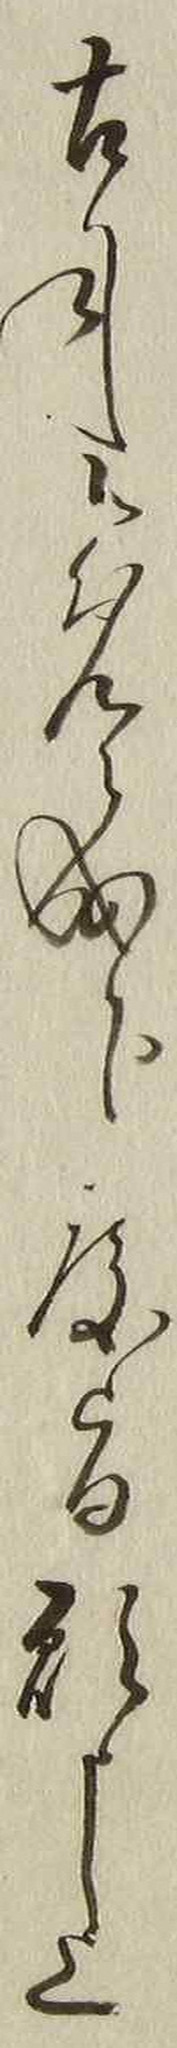古司御免被成下度旨願申上
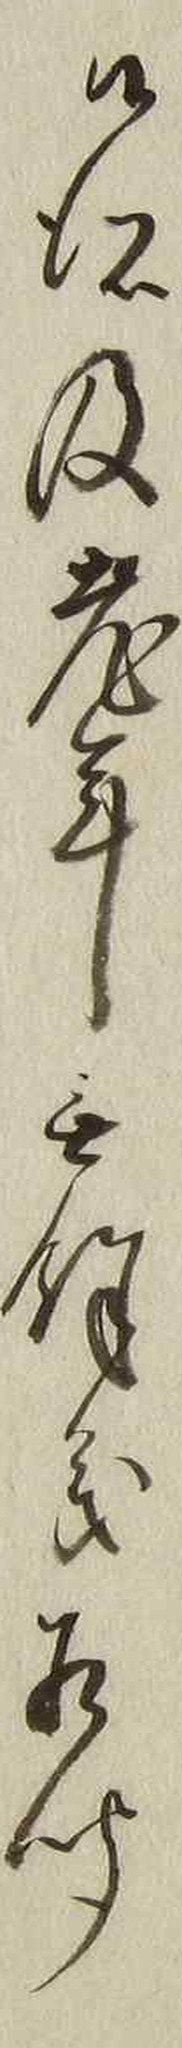候所及老年無余義相聞
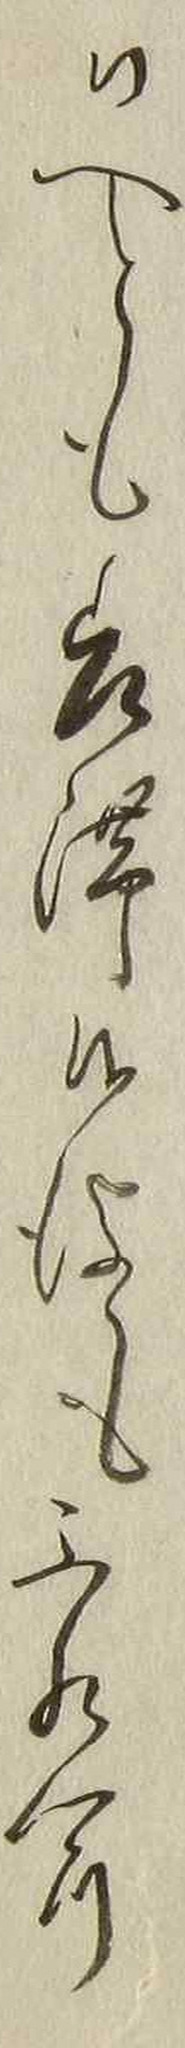候へとも差滞候儀も不相聞
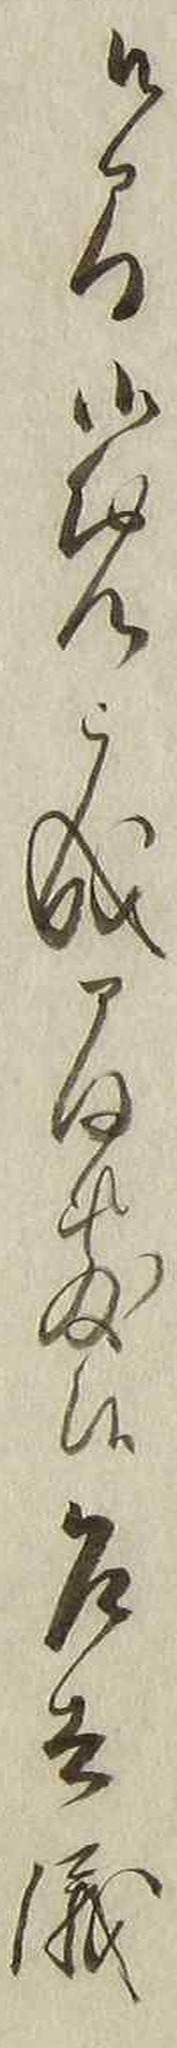候間御免被成間敷候乍太儀
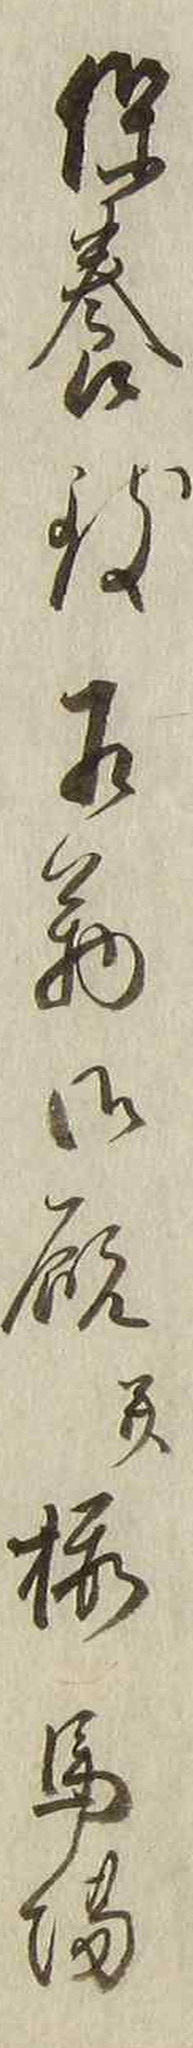保養致相勤御厩并桜馬場
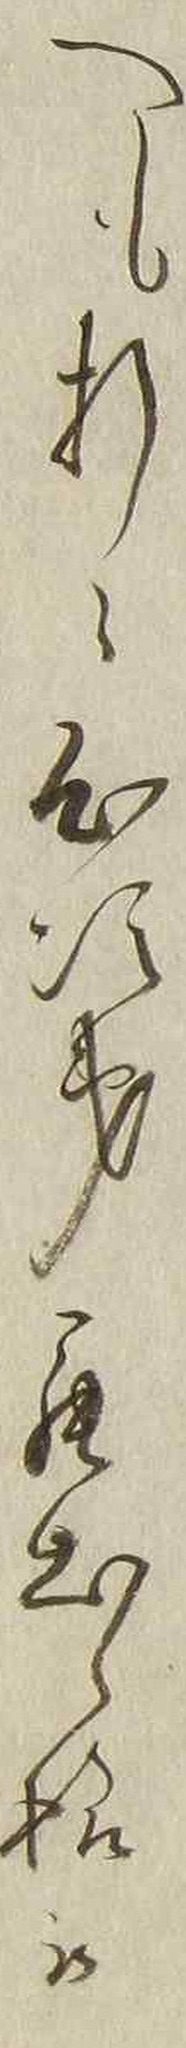へも折々心次第罷出候様被

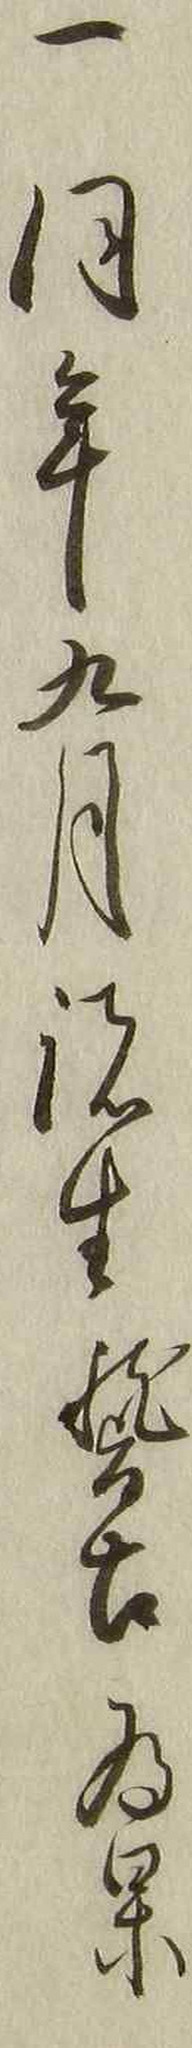一同年九月諸生稽古為果
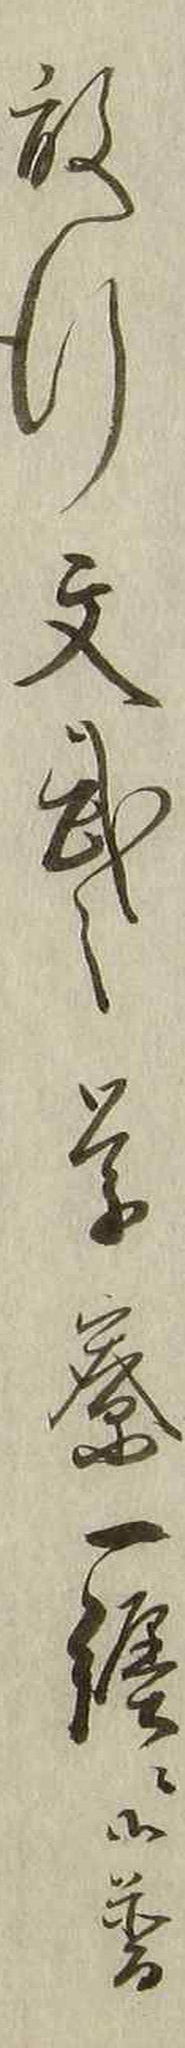敢行文武之学寮一纏ニ御普
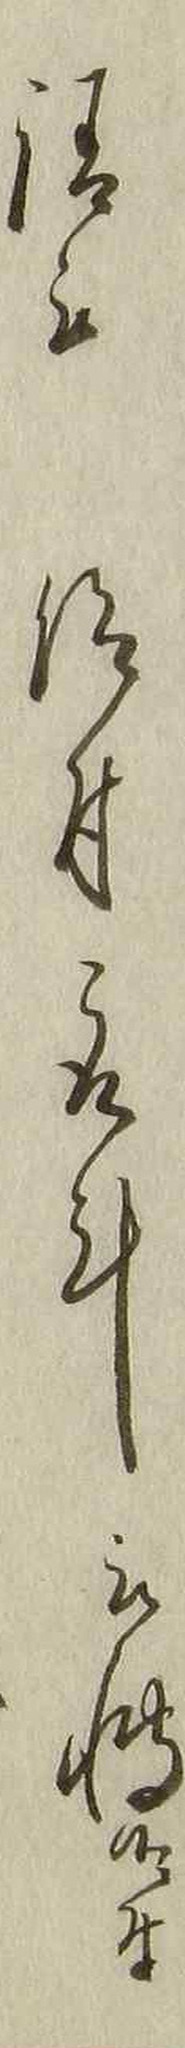請被仰付取計被転候ニ付
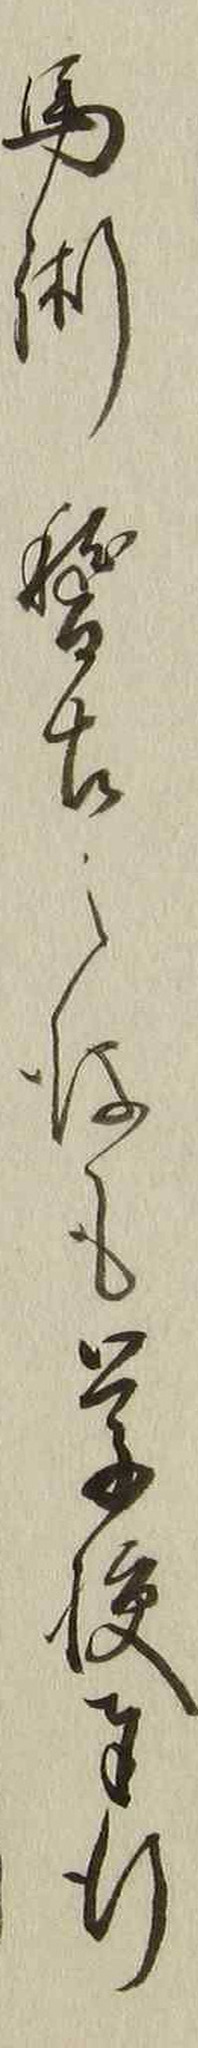馬術稽古之儀も学校奉行
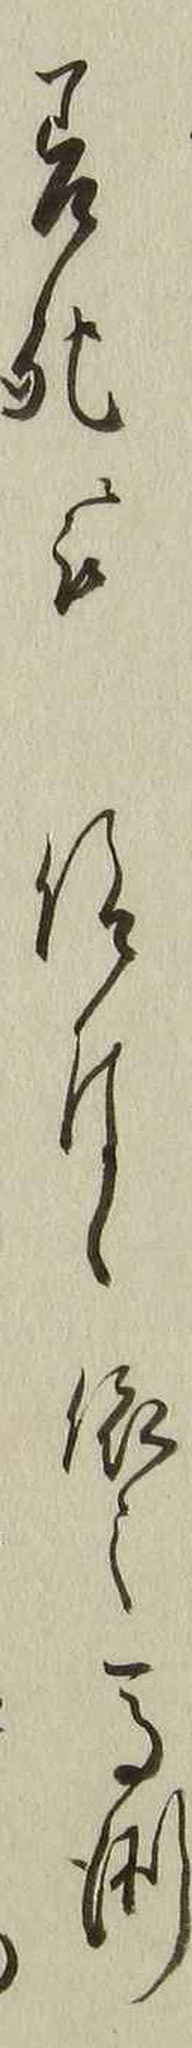差配ニ被仰付候依之馬術
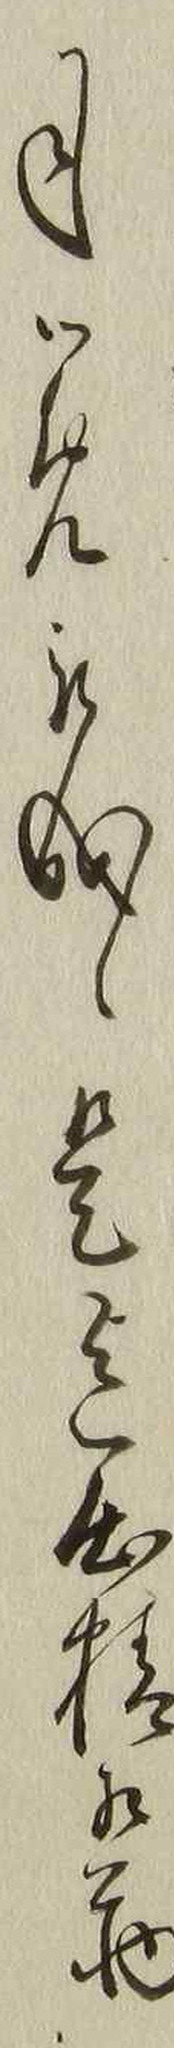司御免被成候是迄出精相勤
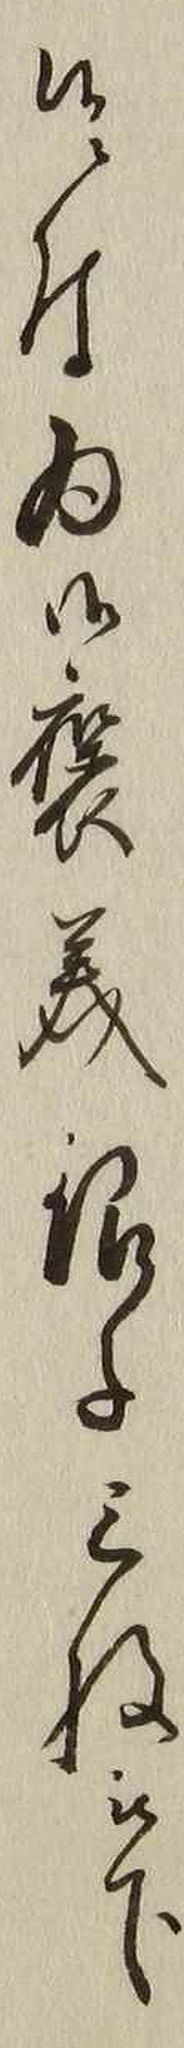候ニ付為御褒美銀子三枚被下
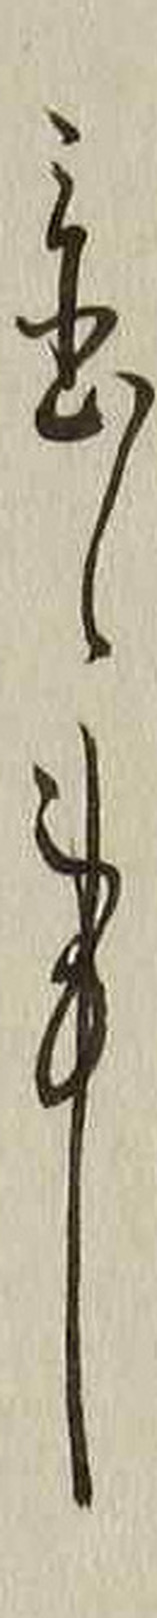置候事
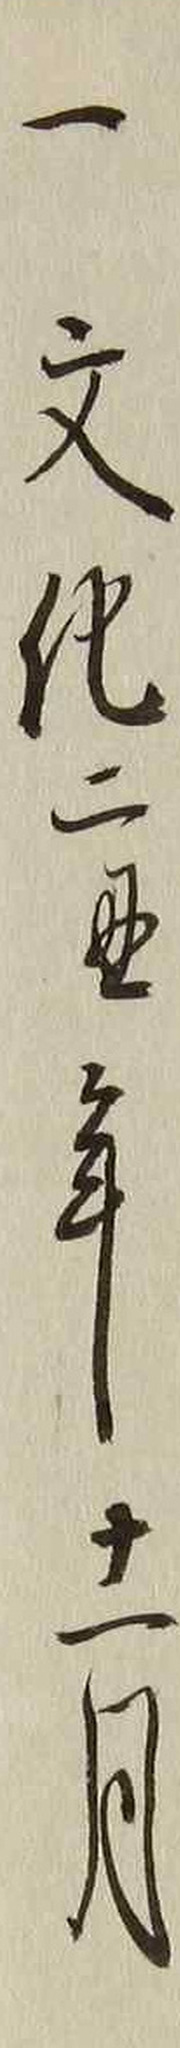一文化二丑年十一月
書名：諸士系譜　巻之18　い之部18
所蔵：会津若松市立会津図書館
